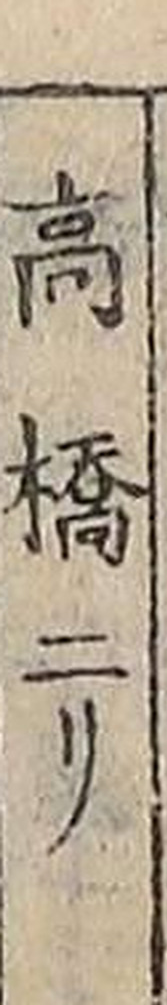高橋二リ
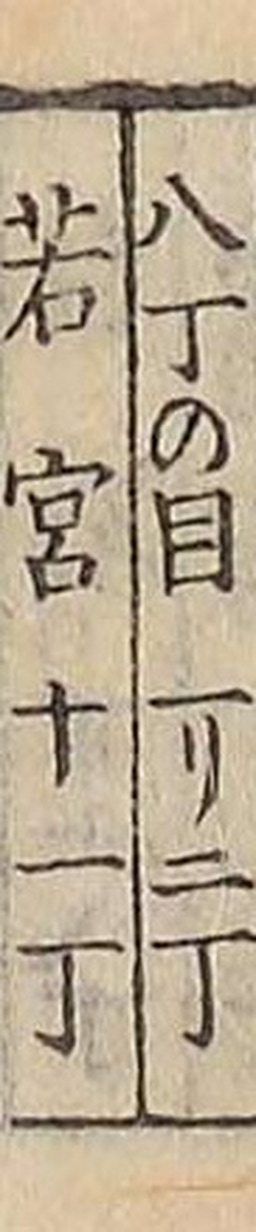若宮十一丁
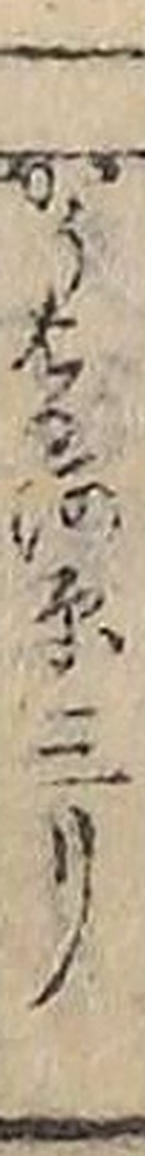かうはる河原三リ
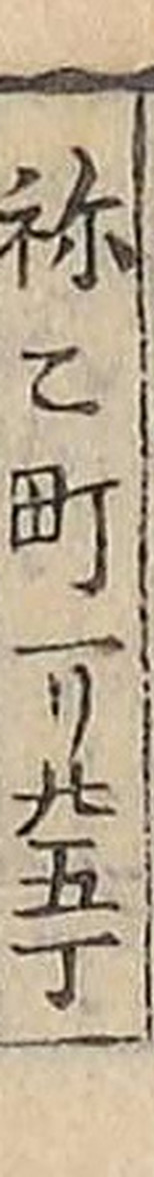ねこ町一リ廿五丁
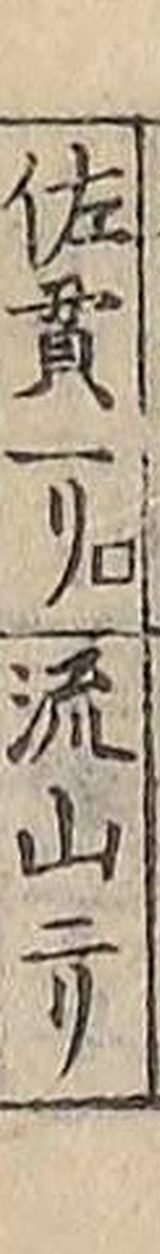佐貫一リ▫流山二リ
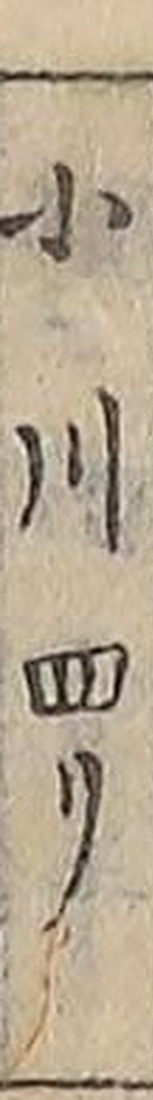小川四り
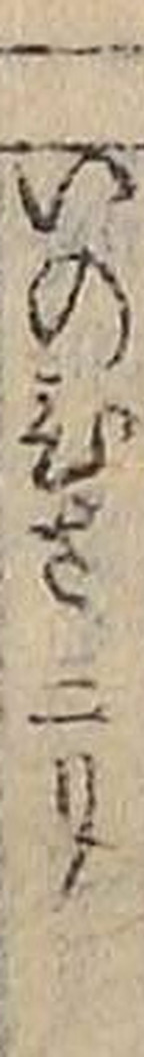いのひさ二リ
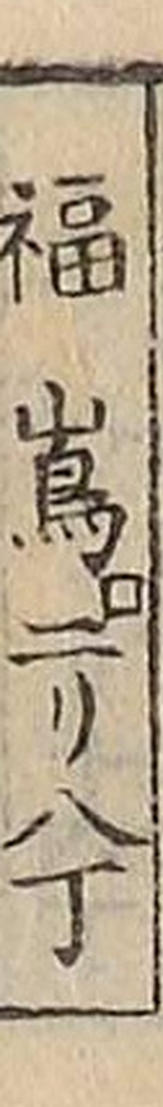福島▫二リ八丁
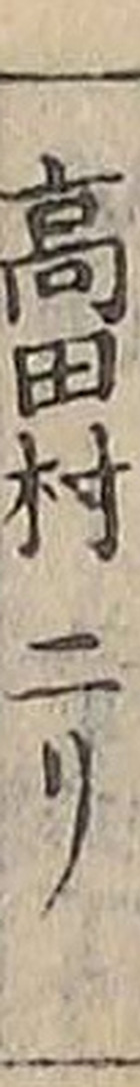高田村二リ
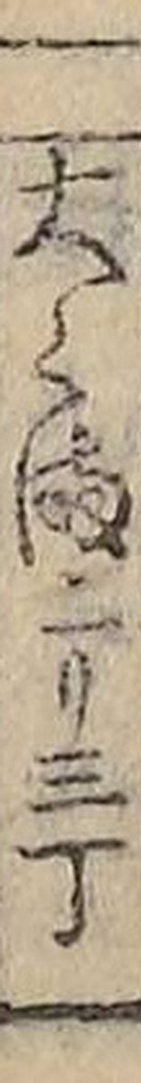大くま二リ三丁
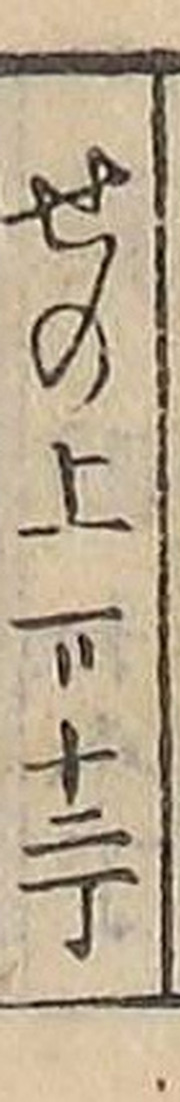せの上一リ十二丁
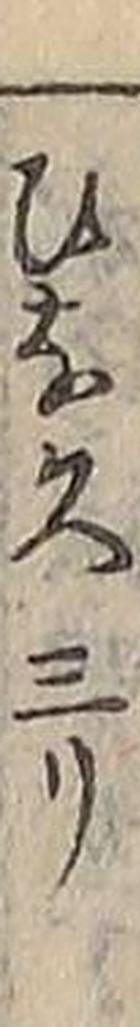ひな久三リ
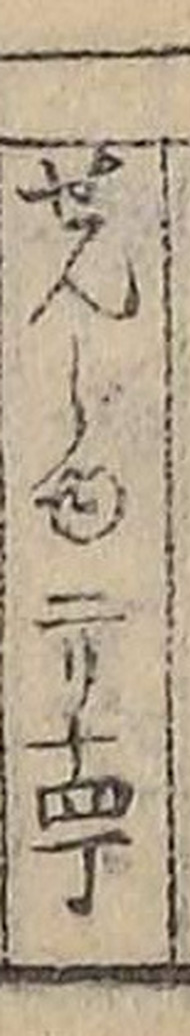せんじゆ二リ十四丁
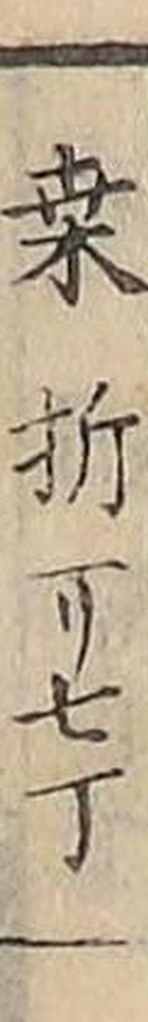桑折一リ七丁
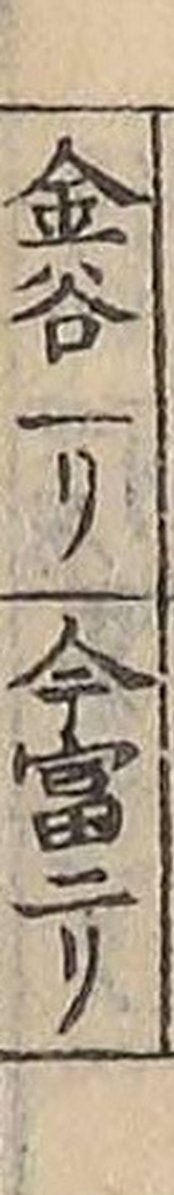金谷一リ今富二リ
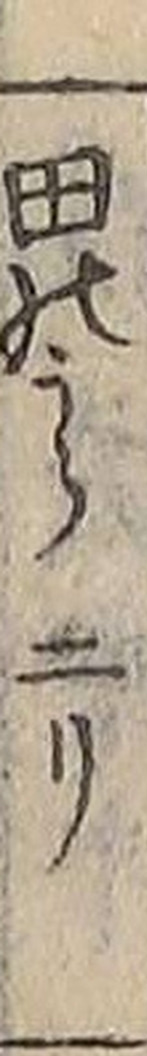田のうら二リ
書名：旅行用心集
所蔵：神戸大学附属図書館 国文学研究資料館
